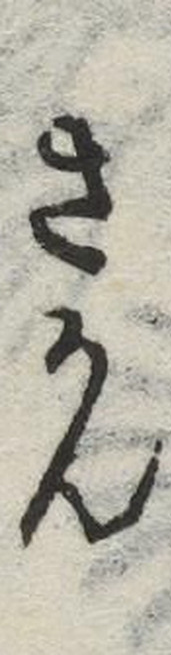さかん
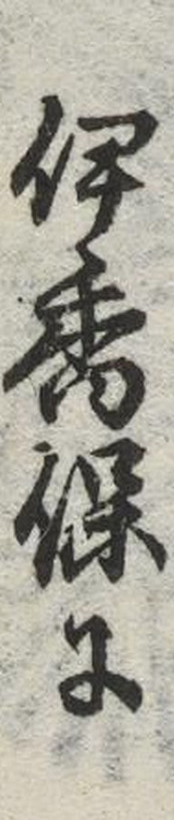伊香保に
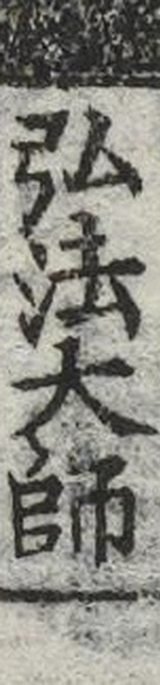弘法大師
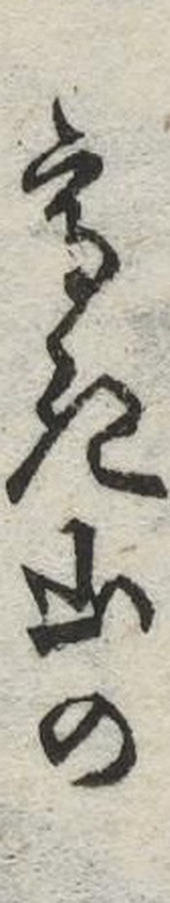高き山の
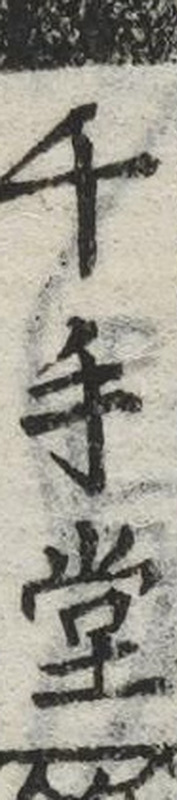千手堂
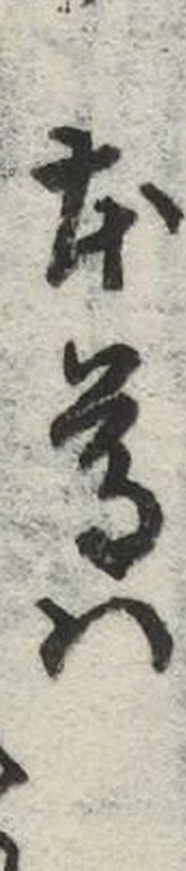本尊は
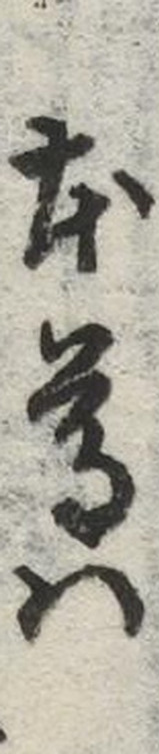本尊は
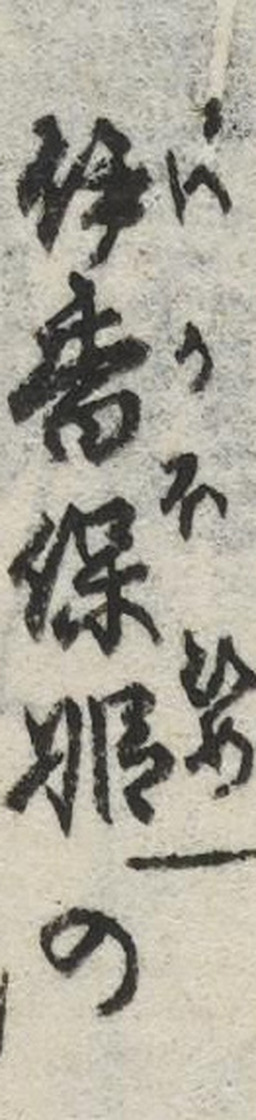伊香保姫の
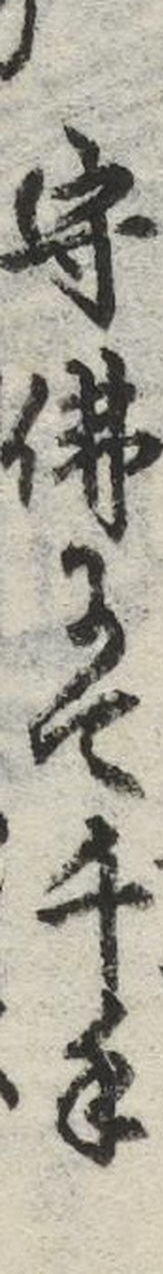守仏にて千手
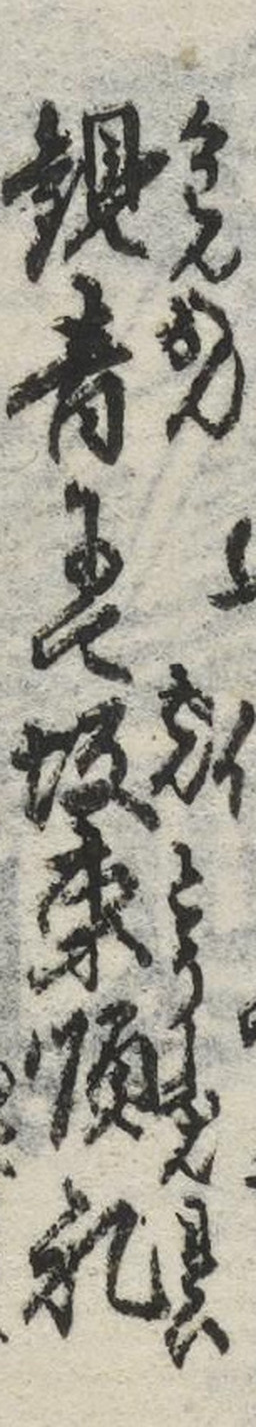観音にて坂東巡礼
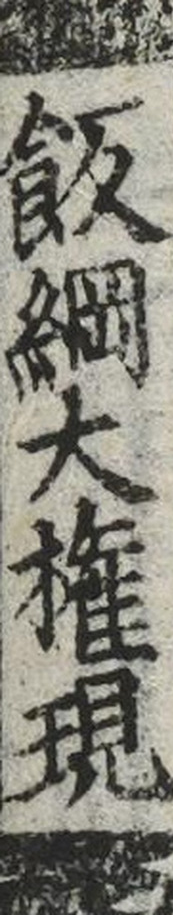飯綱大権現
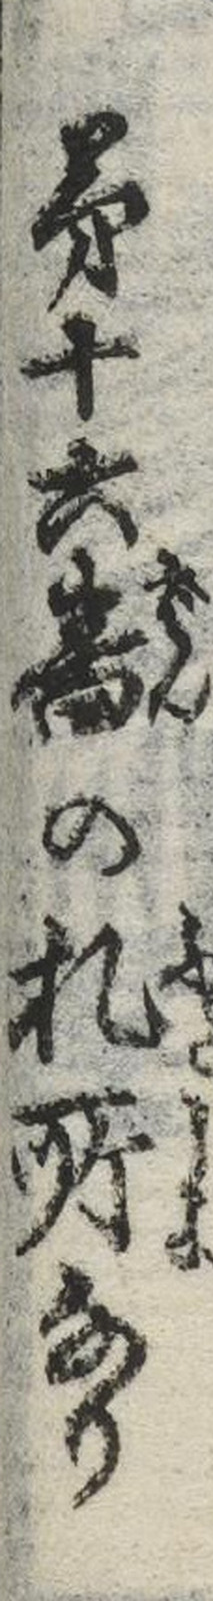第十六番の札所なり
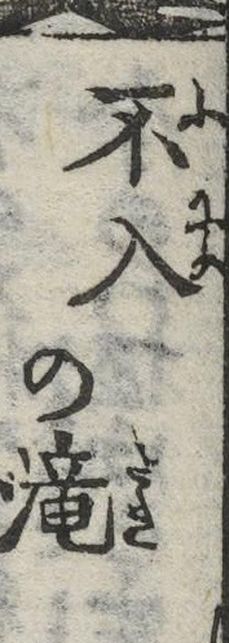不入の滝
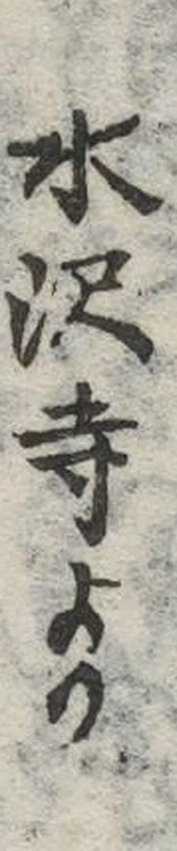水沢寺より
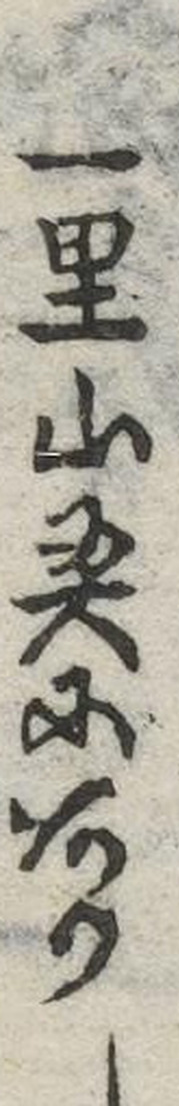一里山奥にあり

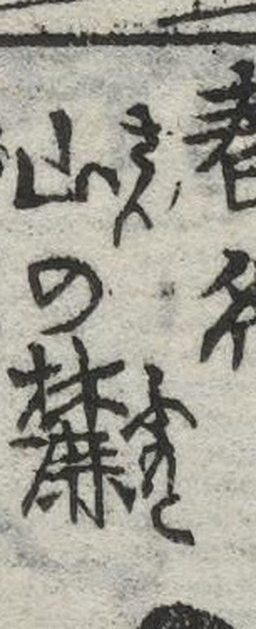山の麓
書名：諸國温泉遊覽記　全
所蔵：東京大学地震研究所図書室 Earthquake Research Institute Library, The University of Tokyo, JAPAN
